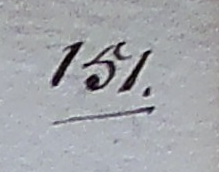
151.
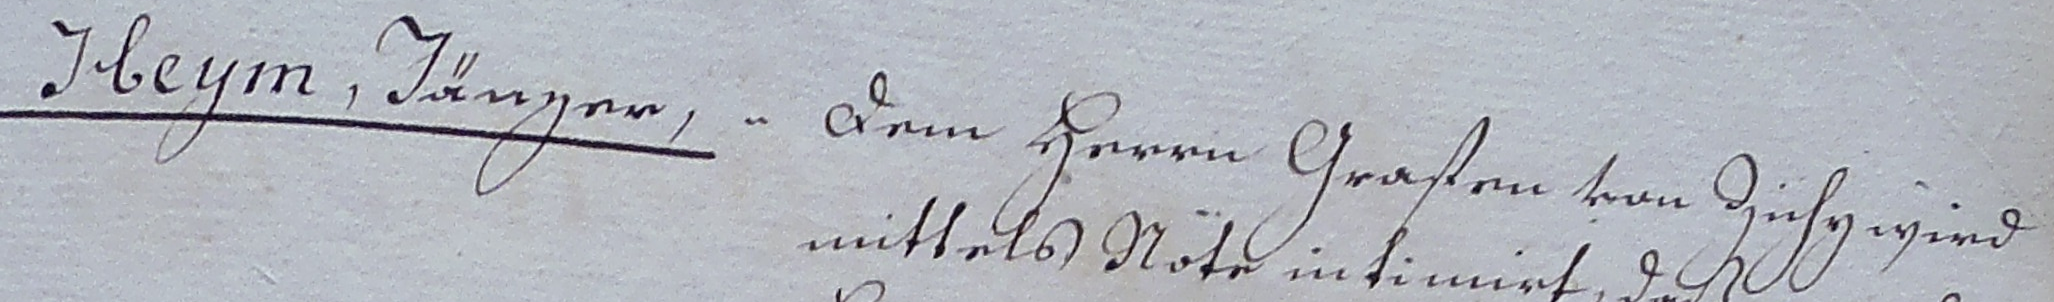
Heym, Tänzer, .. Dem Herrn Grafen von Zichy wird
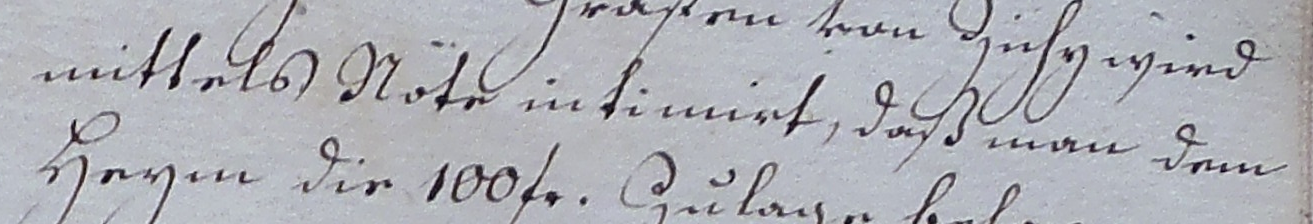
mittels Note intimirt, daß man dem
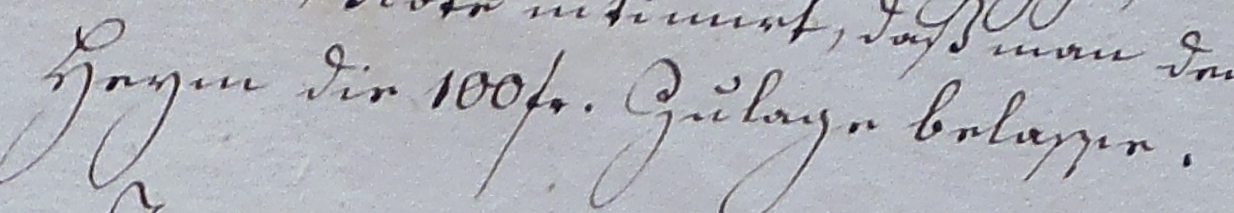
Heym die 100fr. Zulage belasse.
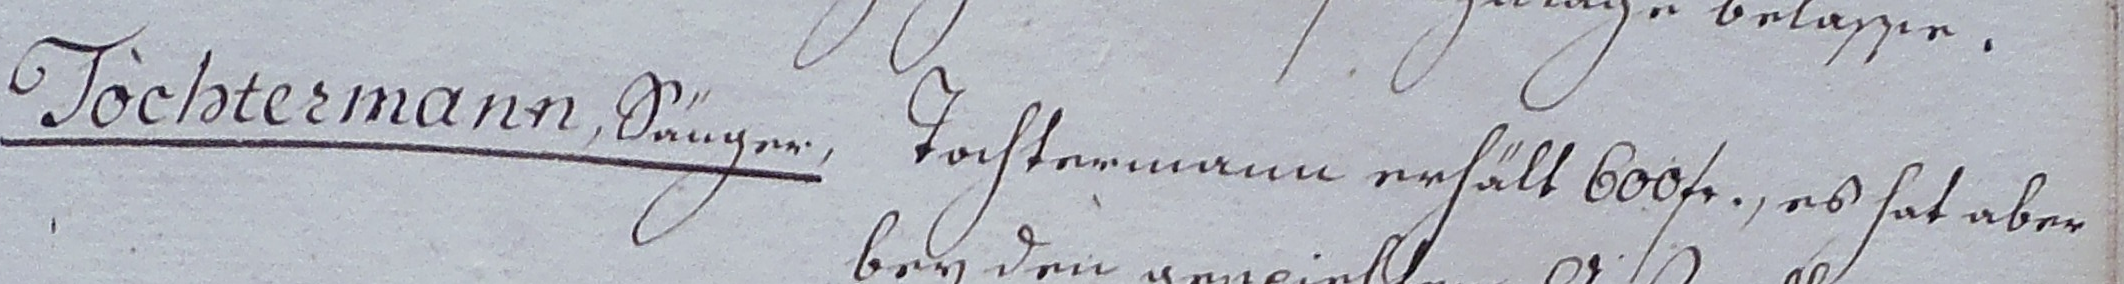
Tochtermann, Sänger, Tochtermann erhält 600fr., es hat aber
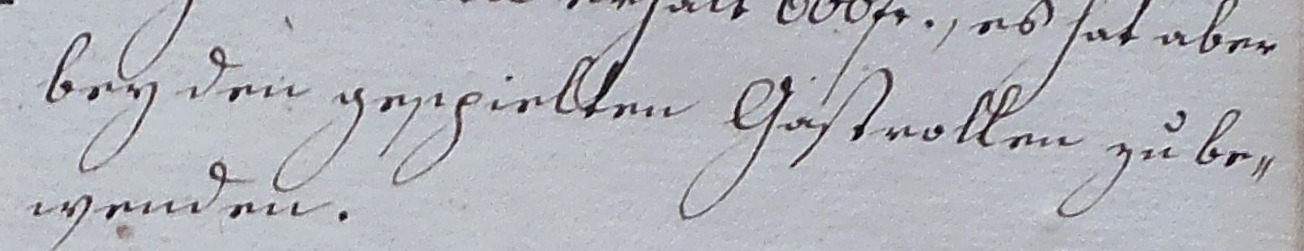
bey den gespielten Gastrollen zu be¬
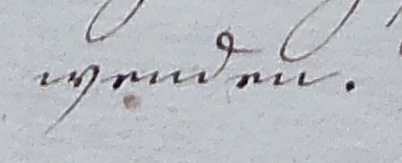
wenden.
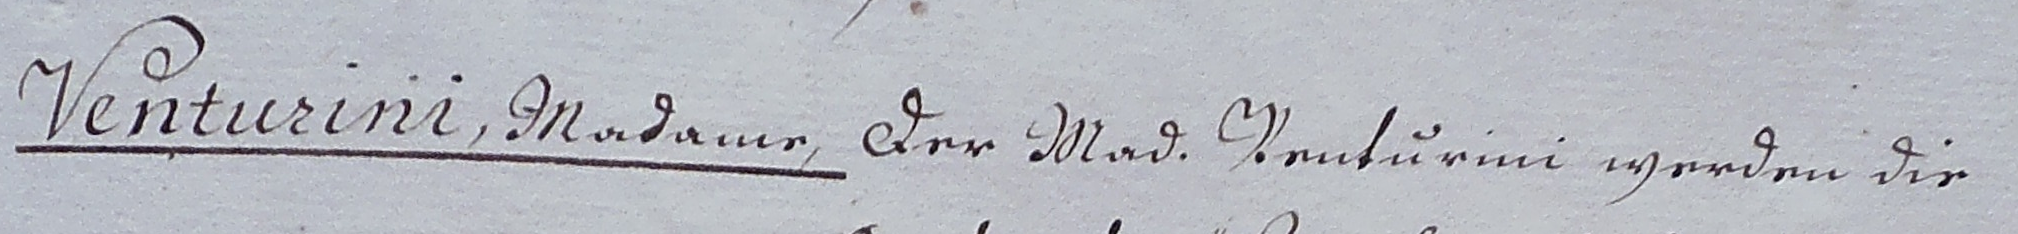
Venturini, Madame, Der Mad. Venturini werden die
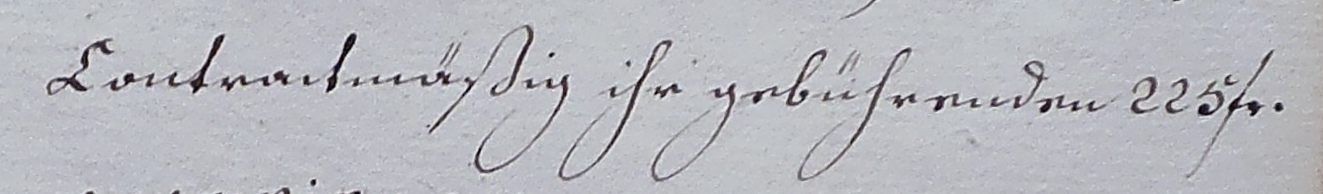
Contractmäßig ihr gebührenden 225fr.
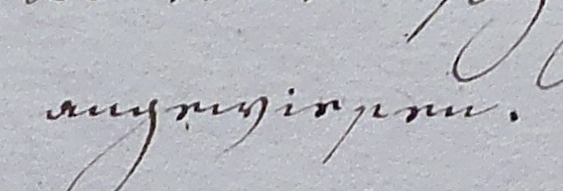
angewiesen.
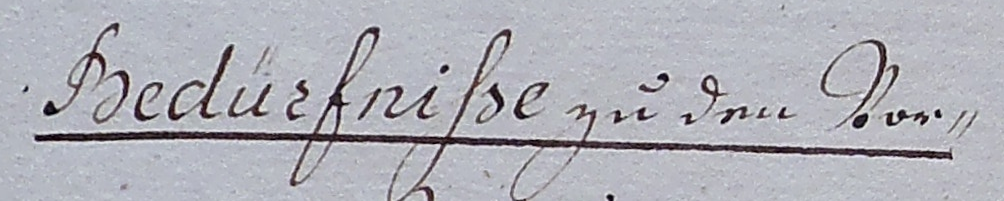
Bedürfnisse zu den Vor¬
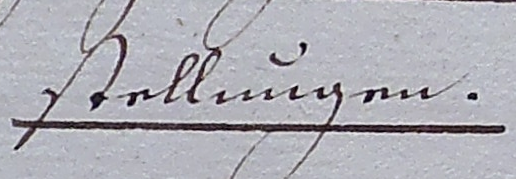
stellungen.
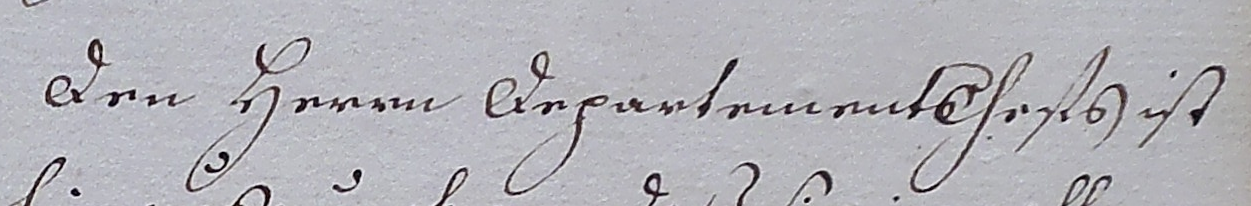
Den Herrn Departenentchefs ist
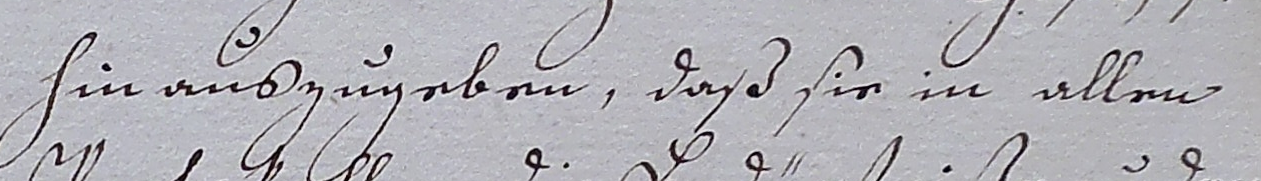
hinauszugeben, daß sie in allen
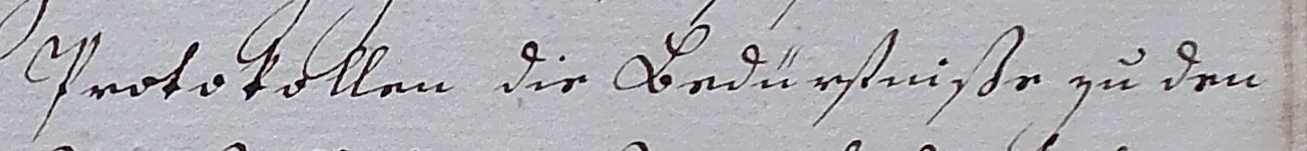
Protokollen die Bedürfniße zu den
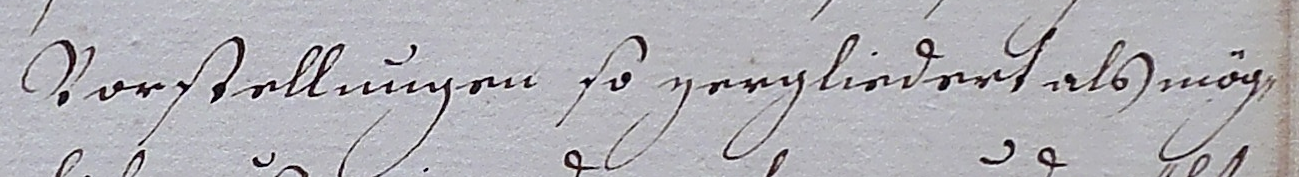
Vorstellungen so zergliedert als mö¬g
